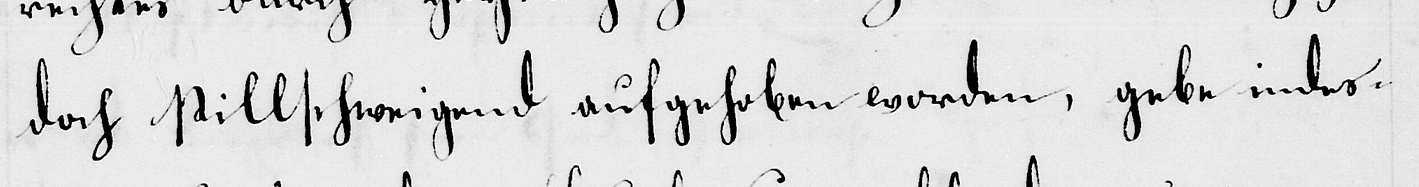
doch stillschweigend aufgehoben worden, gebe indes¬
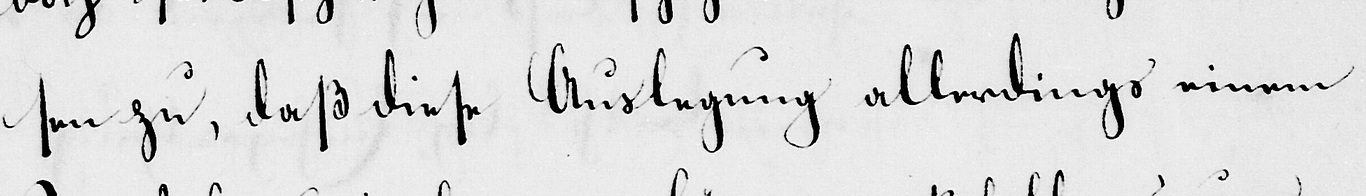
sen zu, daß diese Auslegung allerdings einem
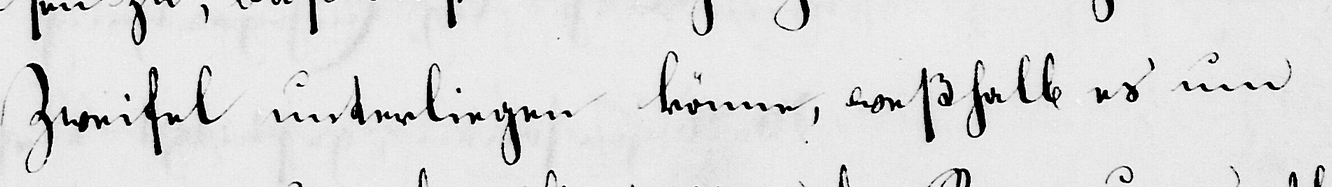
Zweifel unterliegen könne, weßhalb es um
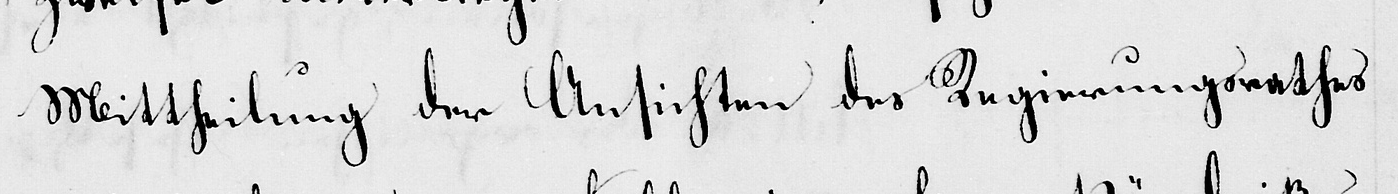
Mittheilung der Ansichten des Regierungsrathes
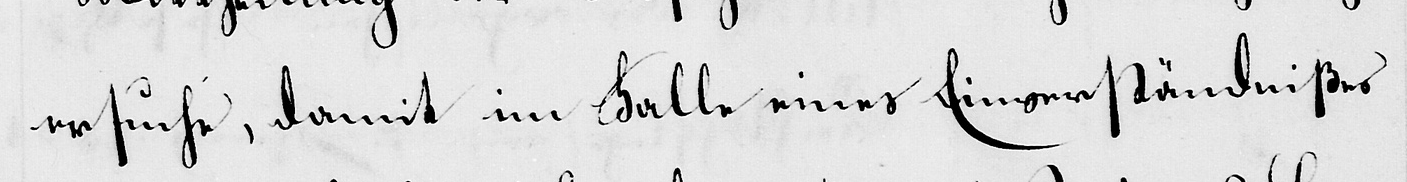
ersuche, damit im Falle eines Einverständnißes
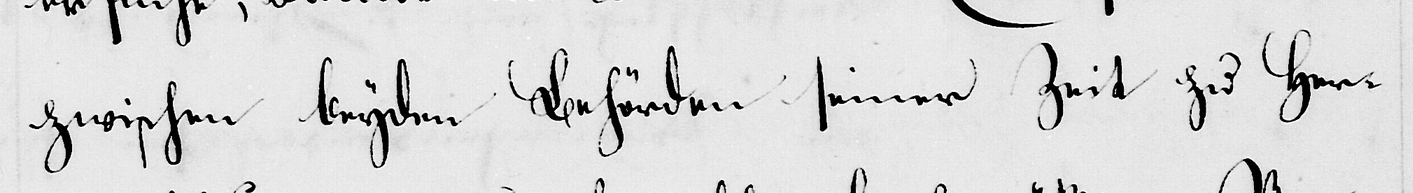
zwischen beyden Behörden seiner Zeit zu Her¬
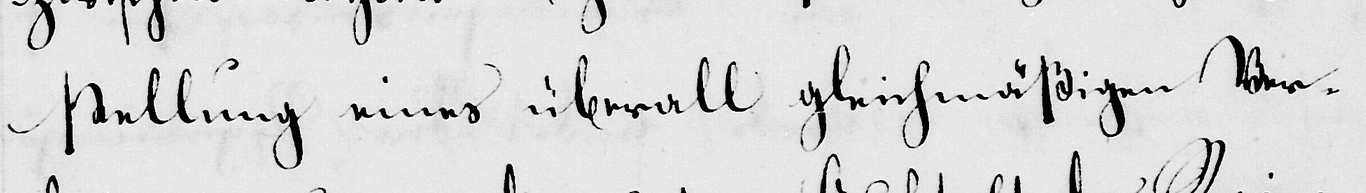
stellung eines überall gleichmäßigen Ver¬
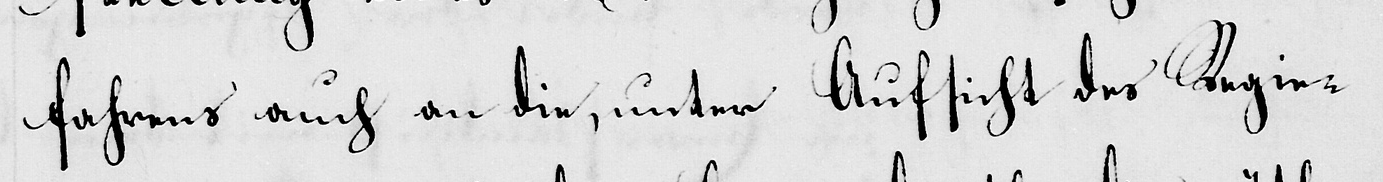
fahrens auch an die, unter Aufsicht des Regie¬
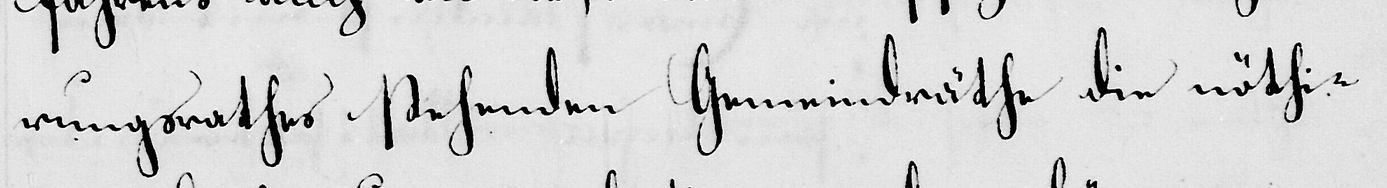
rungsrathes stehenden Gemeindräthe die nöthi¬
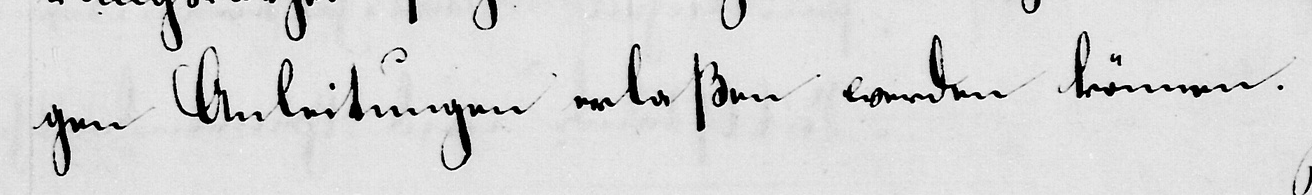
gen Anleitungen erlaßen werden können.
